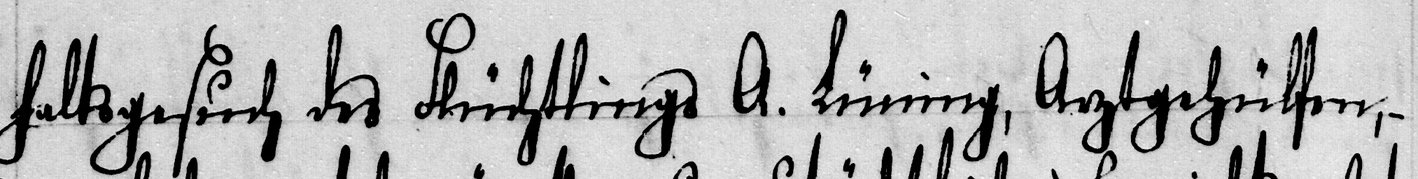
haltsgesuch des Flüchtlings A. Lüning, Artzgehülfen,
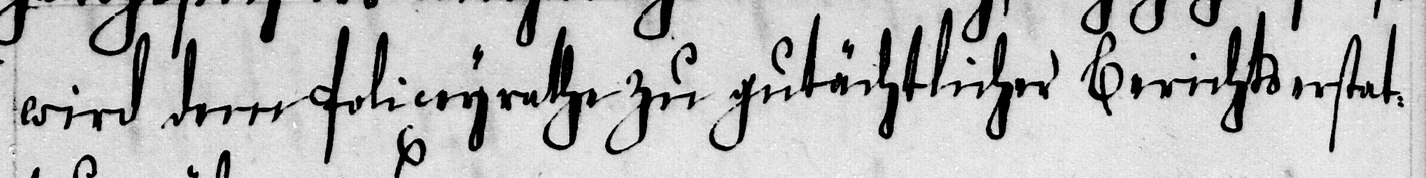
wird dem Policeyrathe zu gutächtlicher Berichtserstat¬
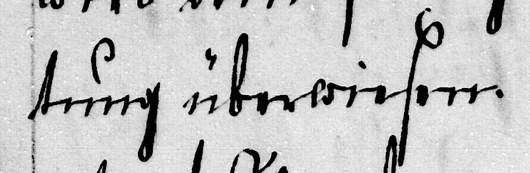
tung überwiesen.
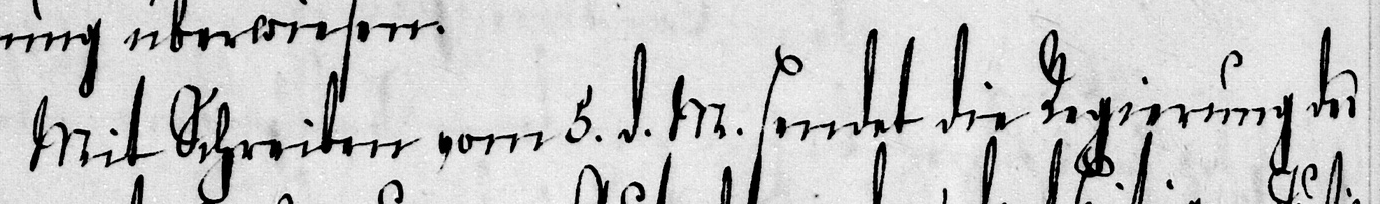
Mit Schreiben vom 5. d. M. sendet die Regierung des
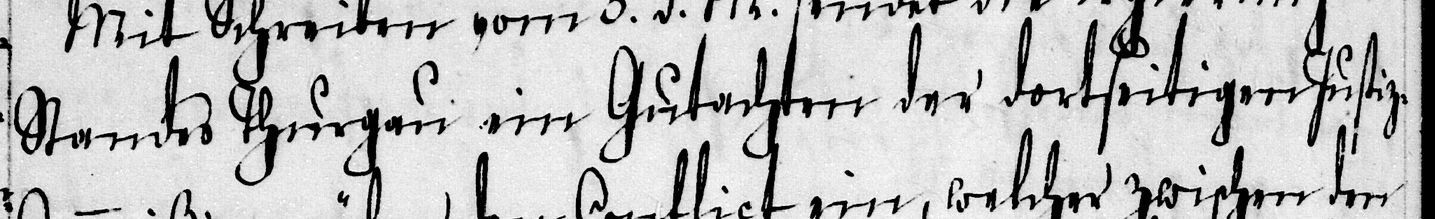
Standes Thurgau ein Gutachten der dortseitigen Just¬
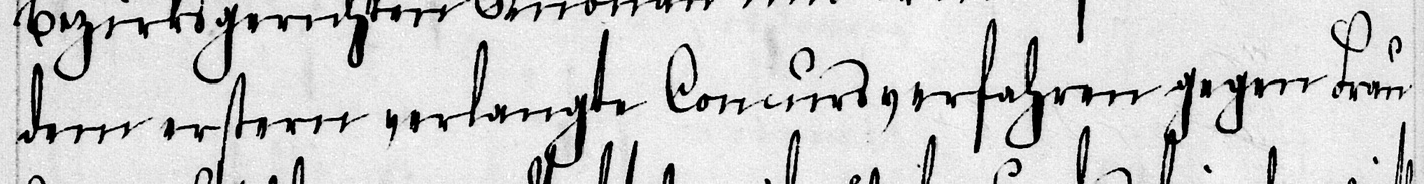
dem erstern verlangte Concursverfahren gegen Frau
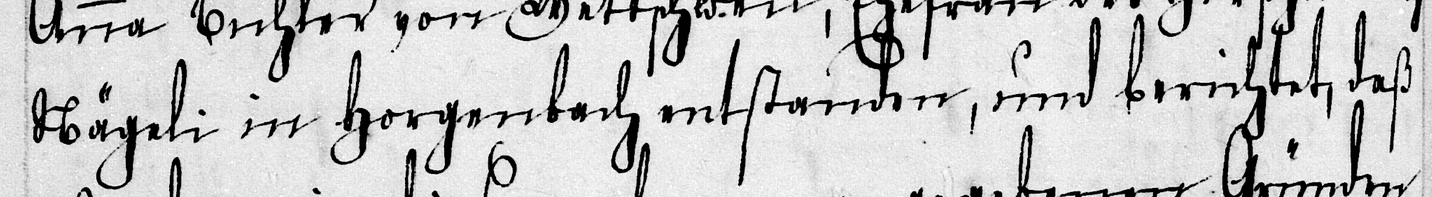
Nägeli in Horgenbach entstanden, und berichtet, daß
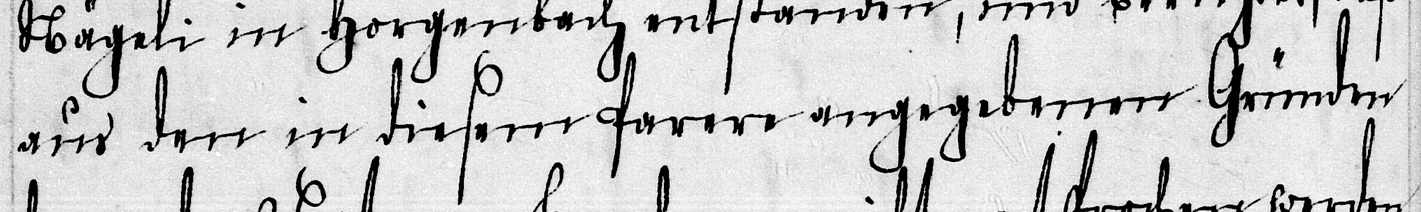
aus den in diesem Parere angegebenen Gründen
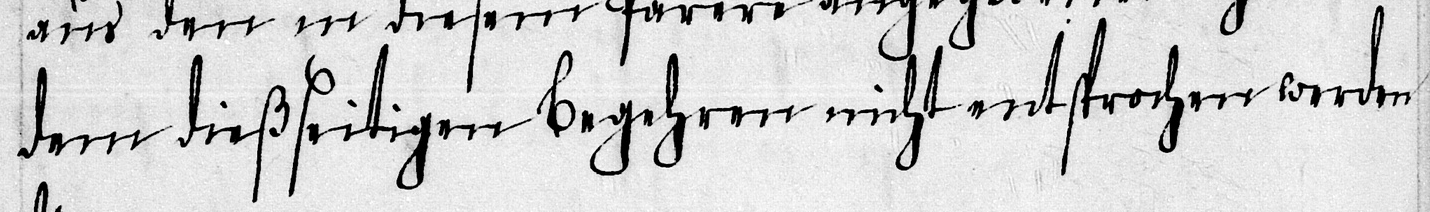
dem dießseitigen Begehren nicht entsprochen werden
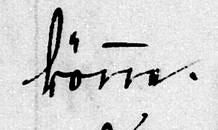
könne.
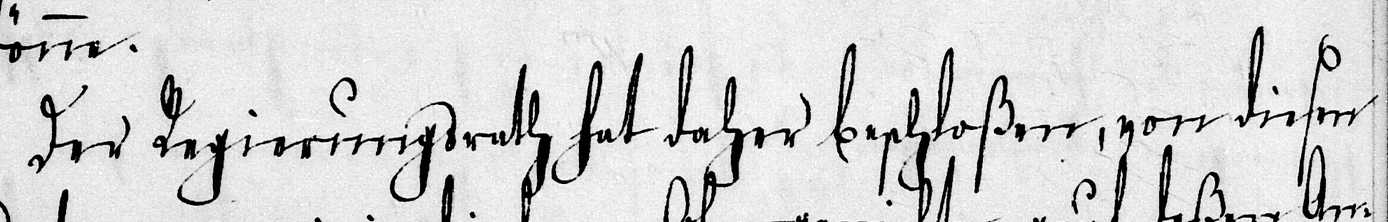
Der Regierungsrath hat daher beschloßen, von diesen
